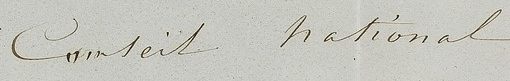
Conseil National
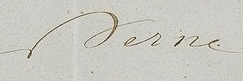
Berne
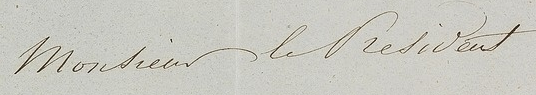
Monsieur le President
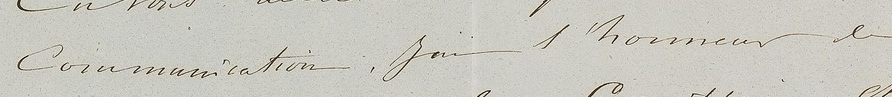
communication, j'ai l'honneur de
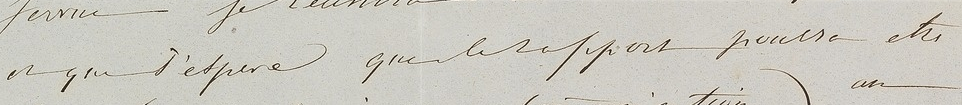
et que l'espere que le rapport pourra etre
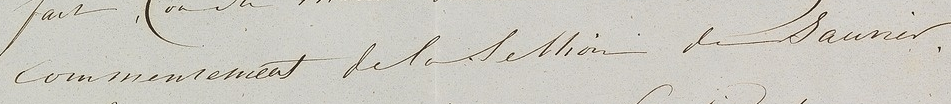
commencement de la session de Janvier.
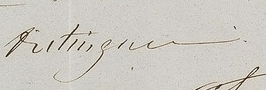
distinguee.
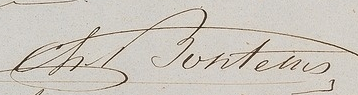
Ch Bontems
